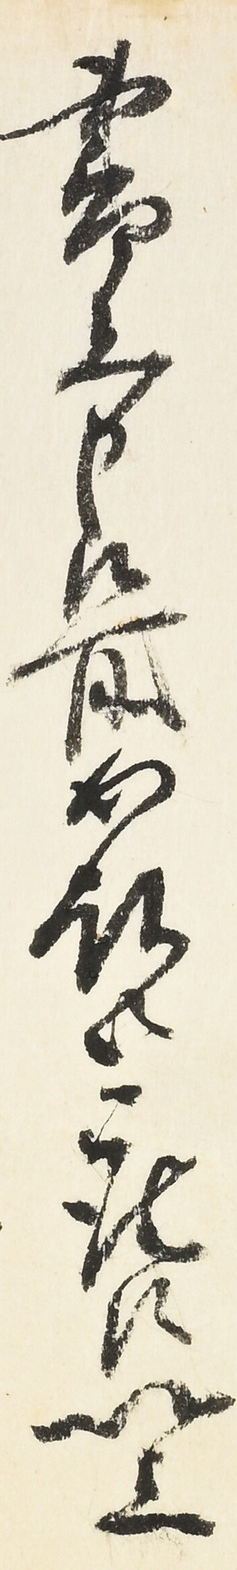書上申候所如斯御座候以上
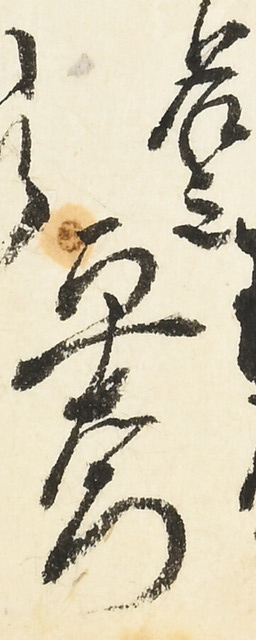金右衛門
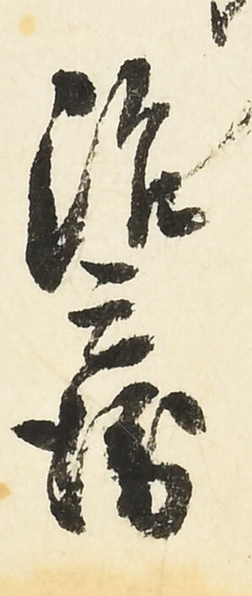治兵衛
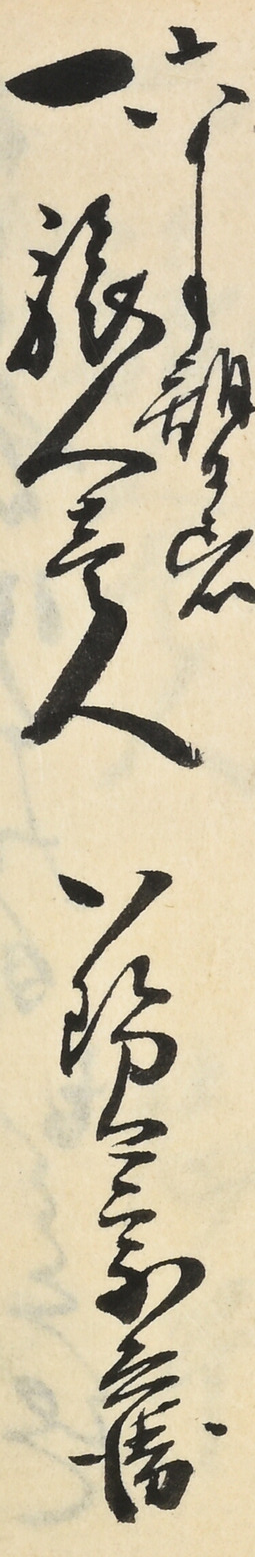一旅人壱人住屋庄兵衛

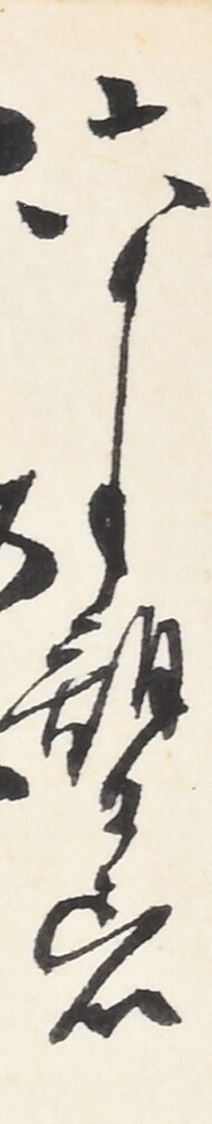六月朔日着
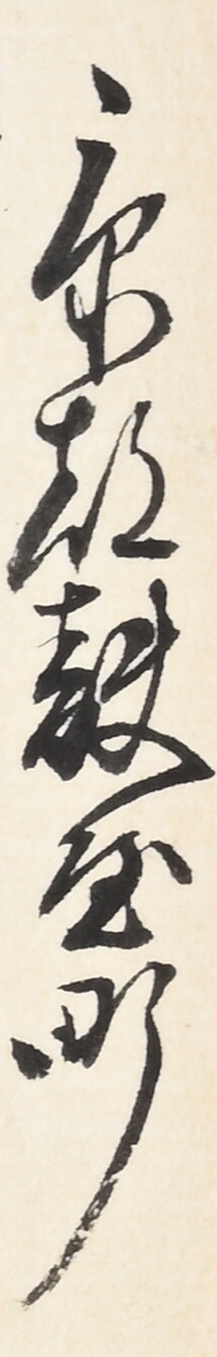京都麩屋町
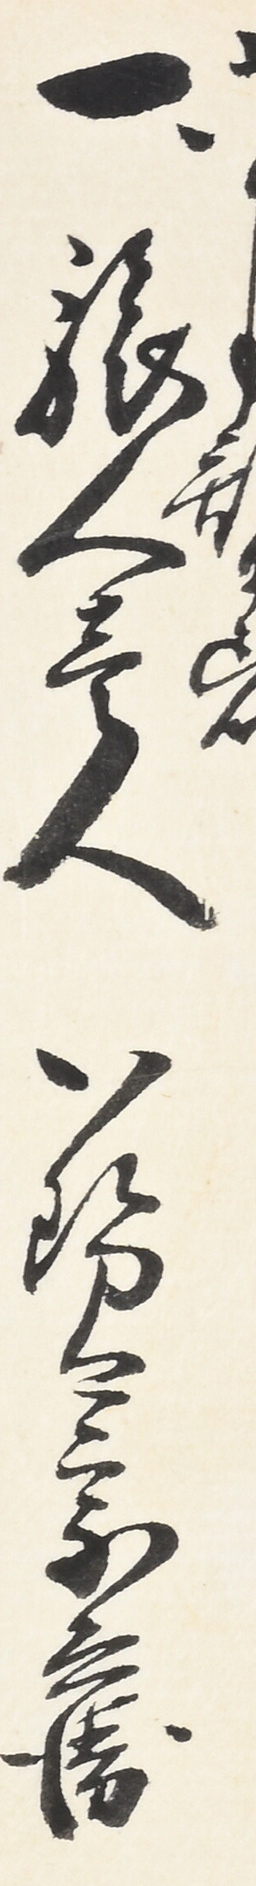一旅人壱人い勢や宗兵衛
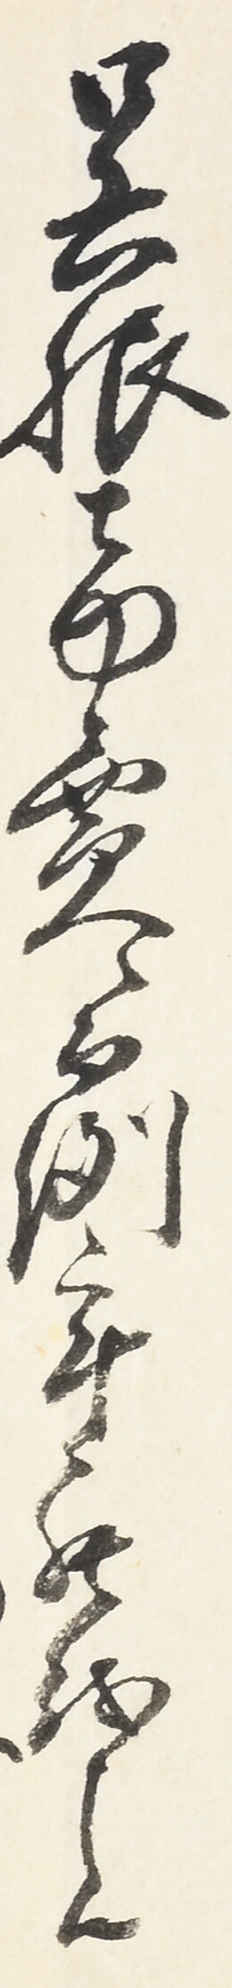呉服商売ニ而例年罷越申候
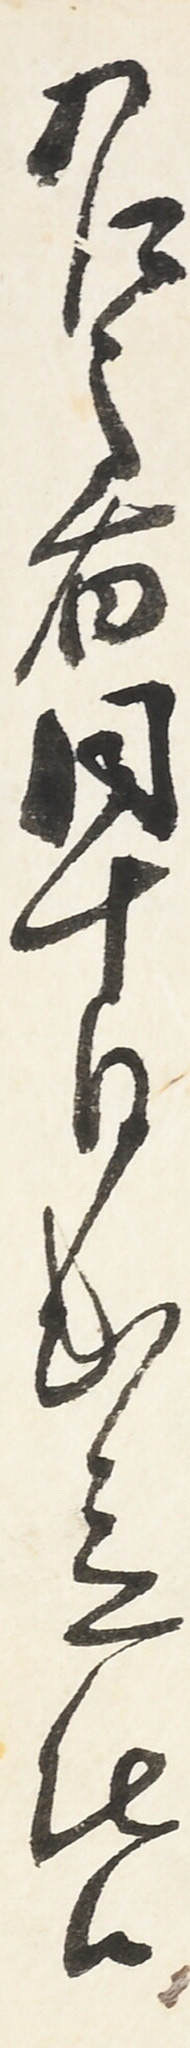右之者同十日出立仕候
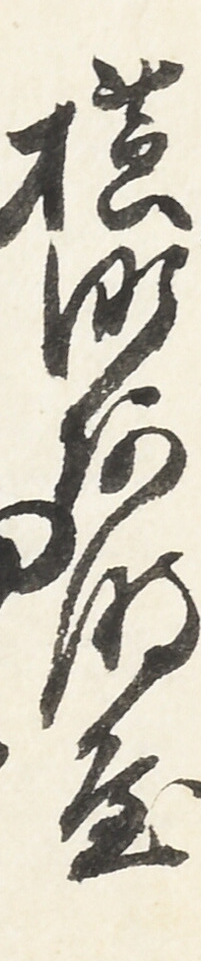横町阿波屋
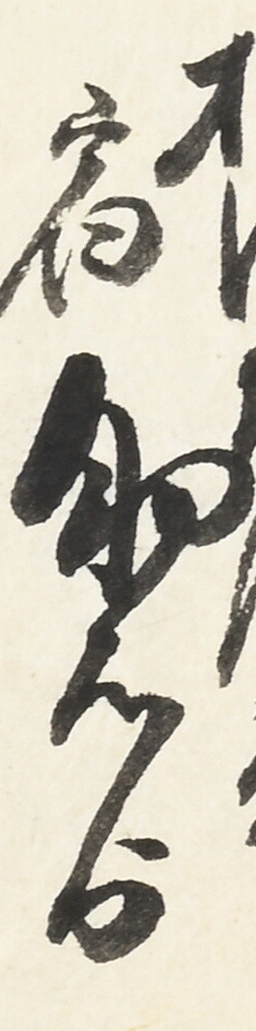宿助右衛門
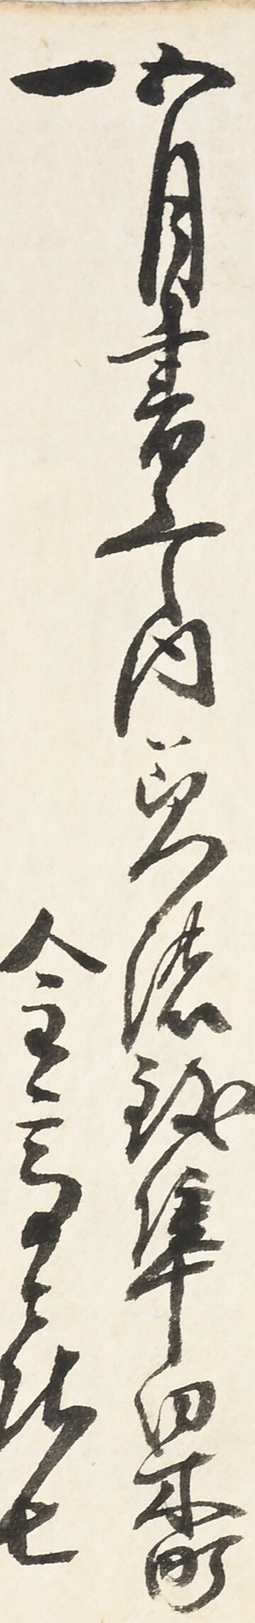五月書上之内美濃致隼田木町
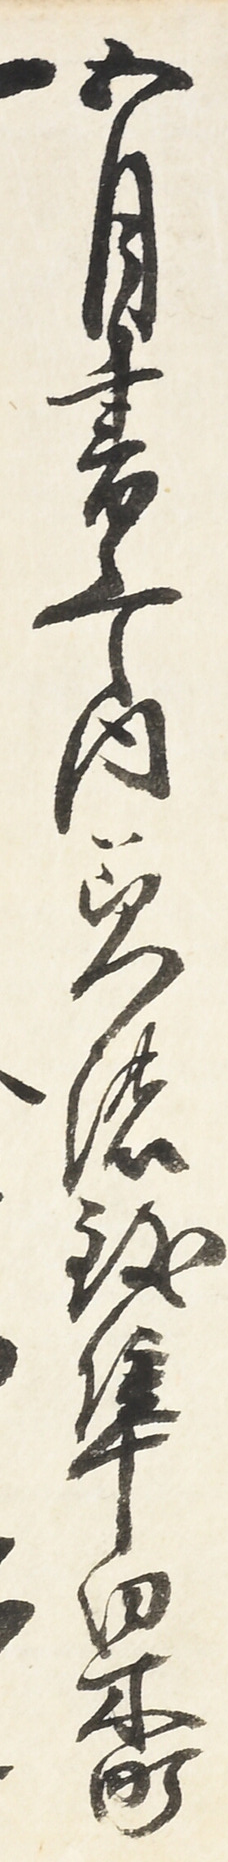五月書上之内美濃致隼田木町
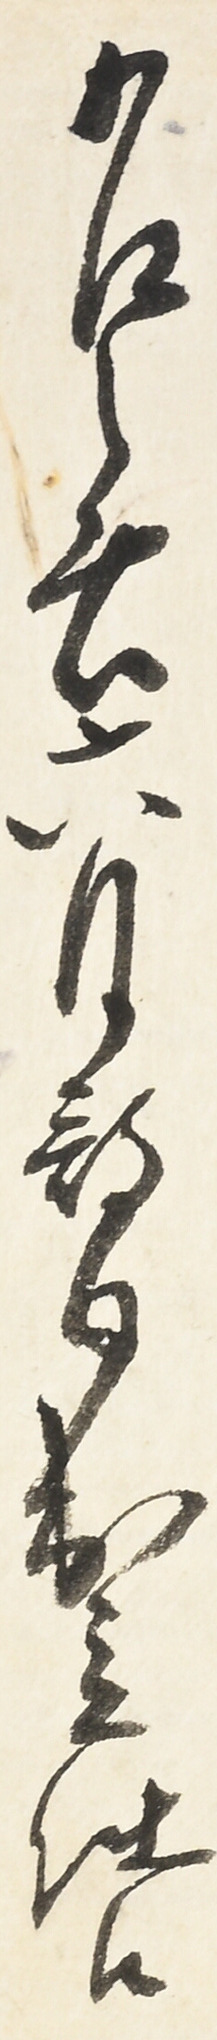右之者六月朔日出立仕候
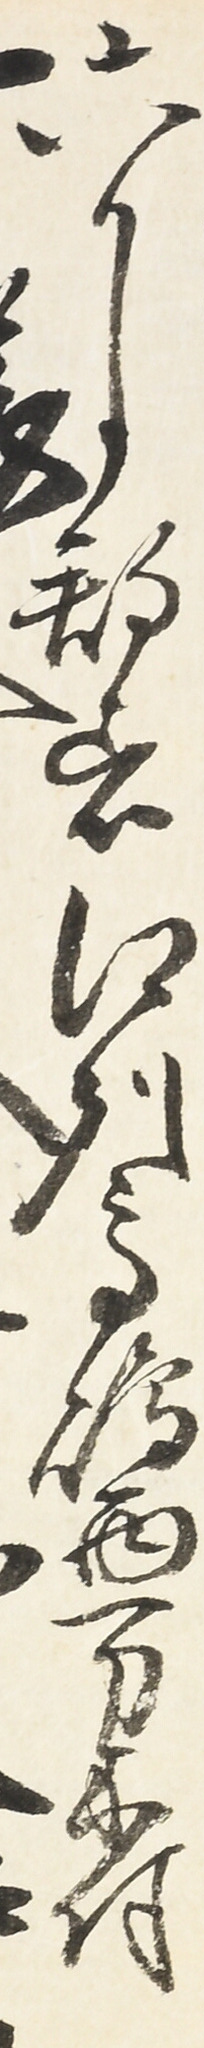六月朔着江州高嶋西万木村
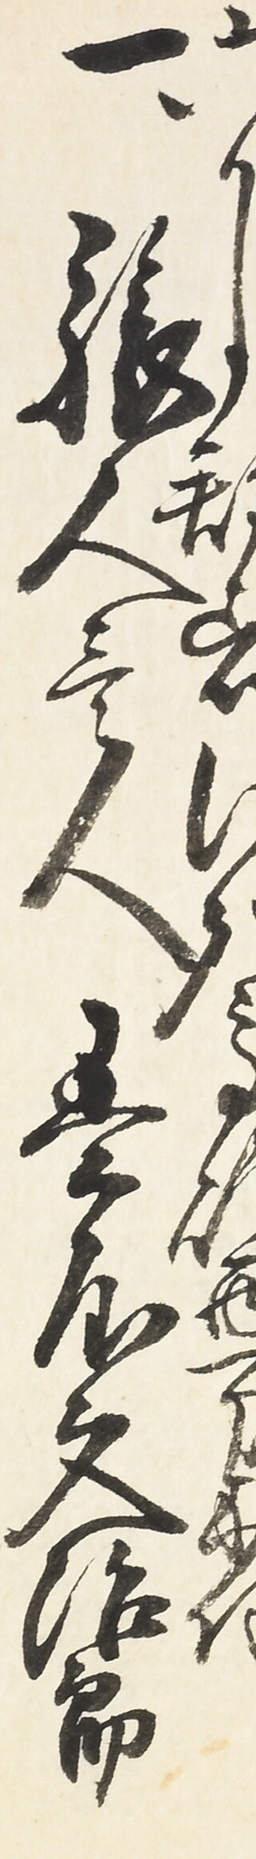一旅人壱人墨屋文治郎
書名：町中旅人泊控帳
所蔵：伊那市立高遠町図書館・合同会社AMANE
